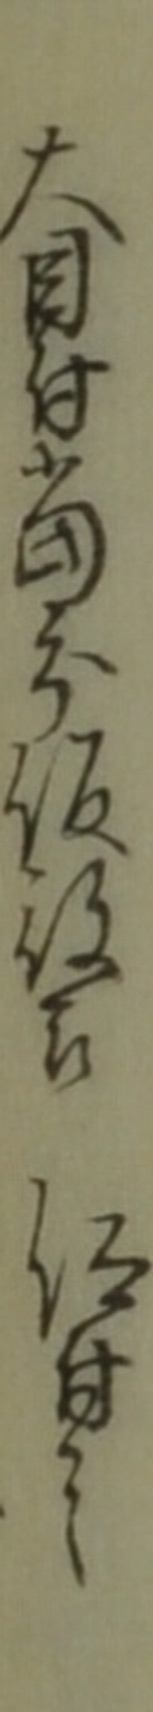大目付当分仮役被仰付之
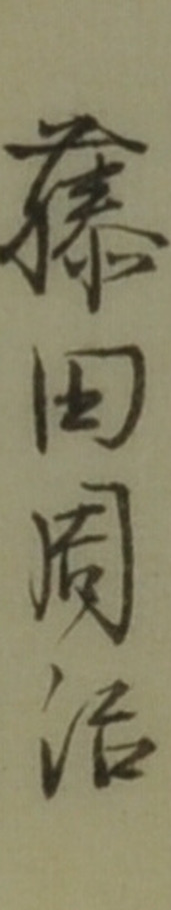藤田周治
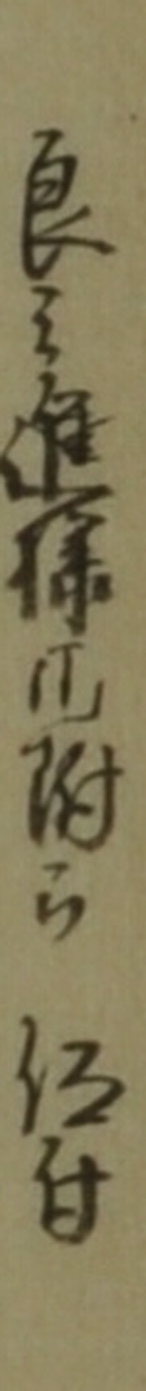良之進様御附被仰付

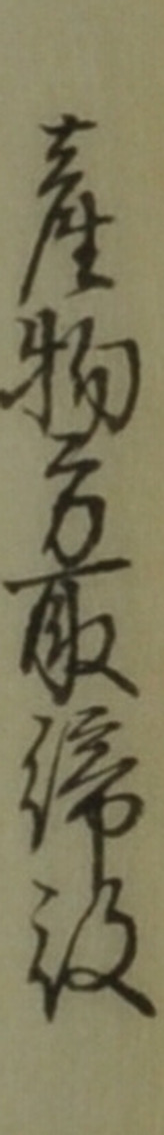産物方取締役
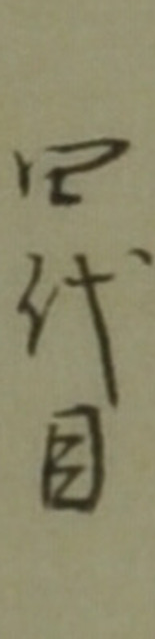四代目
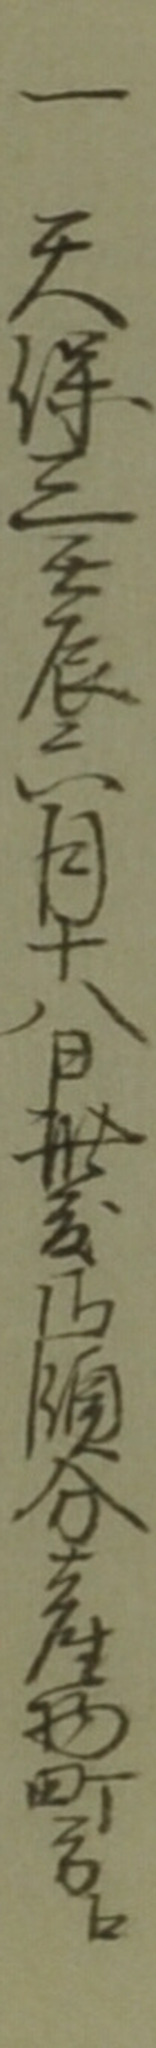一天保三壬辰六月十八日此度御領分産物町方江
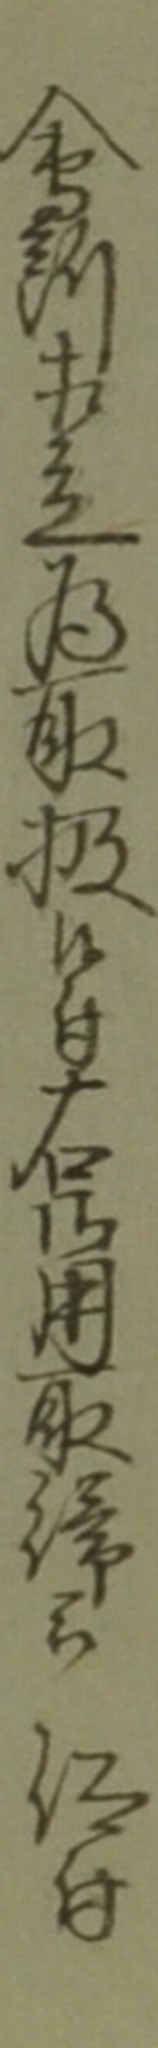会所相立為取扱候付右御用取締被仰付
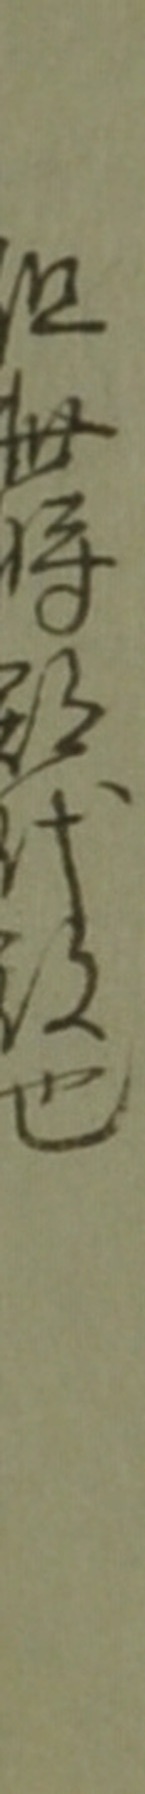但此時郡代役也
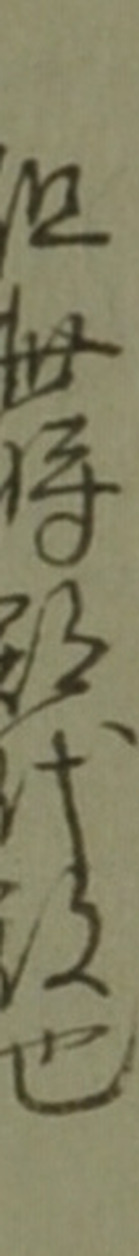但此時郡代役也
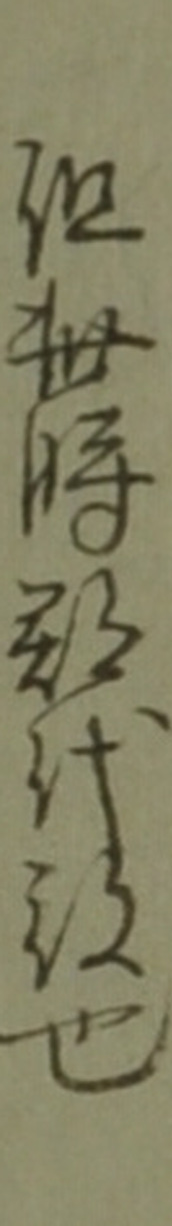但此時郡代役也
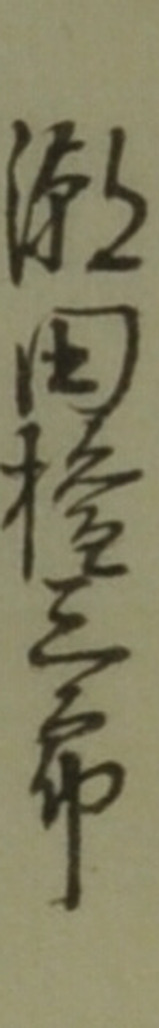瀬田権三郎
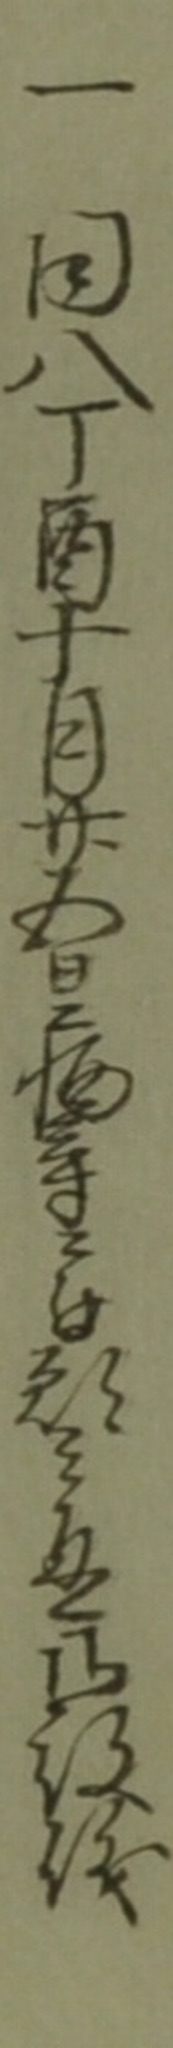一同八丁酉十月廿五日病気ニ付願之通御役儀
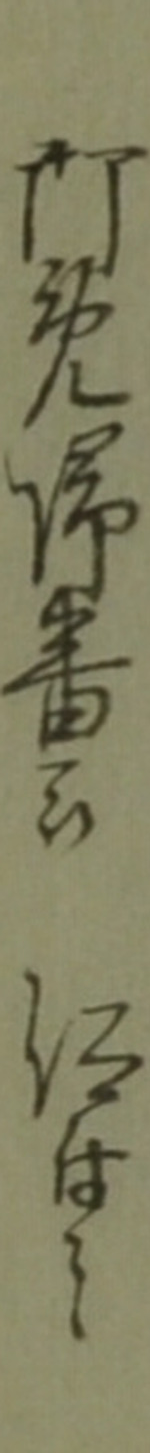御免帰番被仰付之
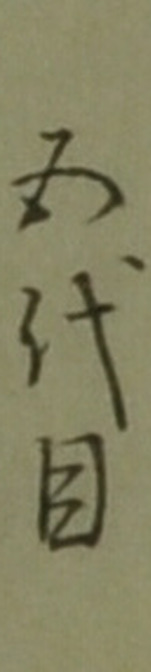五代目
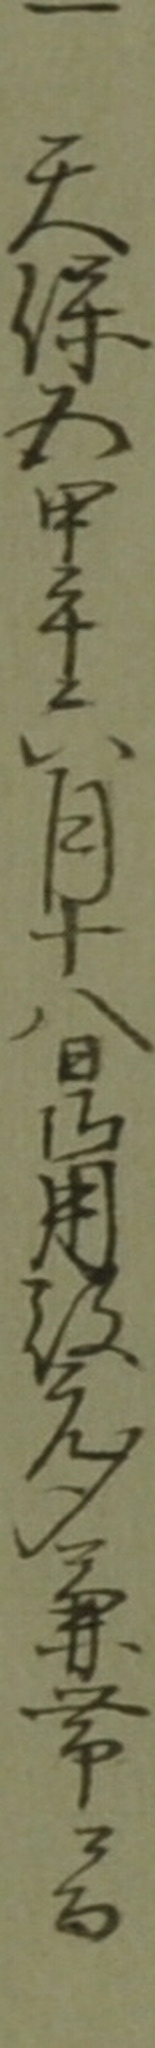一天保五甲午年六月十八日御用役元〆兼帯ニ而
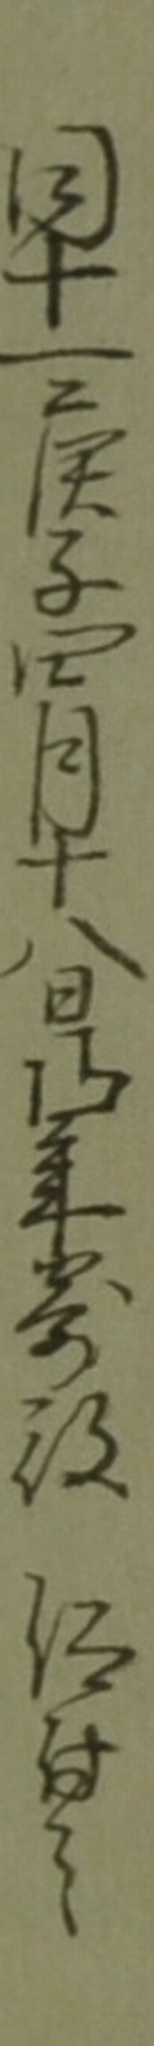一同十一庚子四月十八日御年寄役仰付之
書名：諸御役代々録（三）
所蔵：伊那市立高遠町図書館・合同会社AMANE
